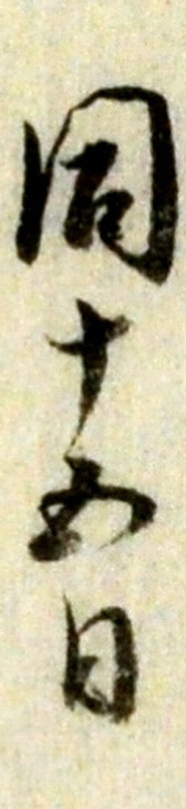同十五日
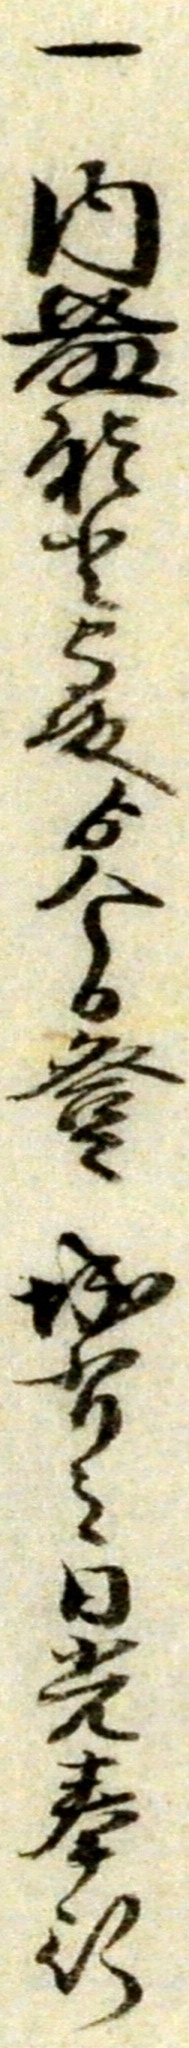一内藤能登守殿ゟ今日登城有之日光奉行
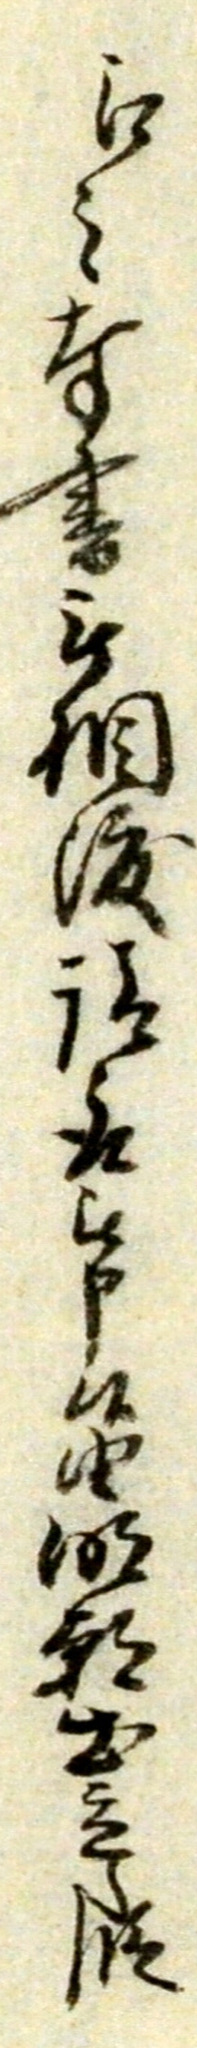江之奉書被相渡請取被申候由明朝出立之段
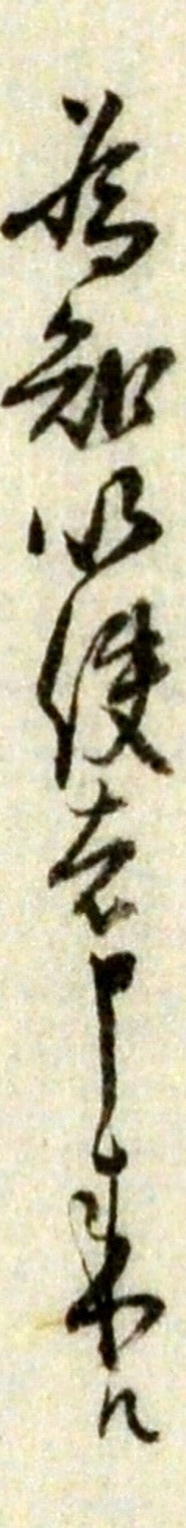為知以使者申来ㇽ
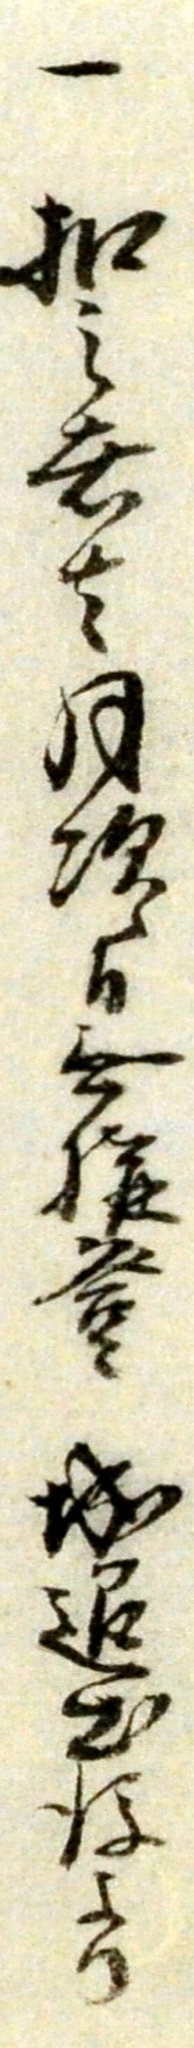一扣之者者月次二付無構登城退出後より
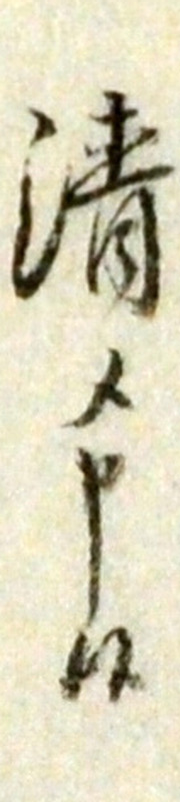清メ申候
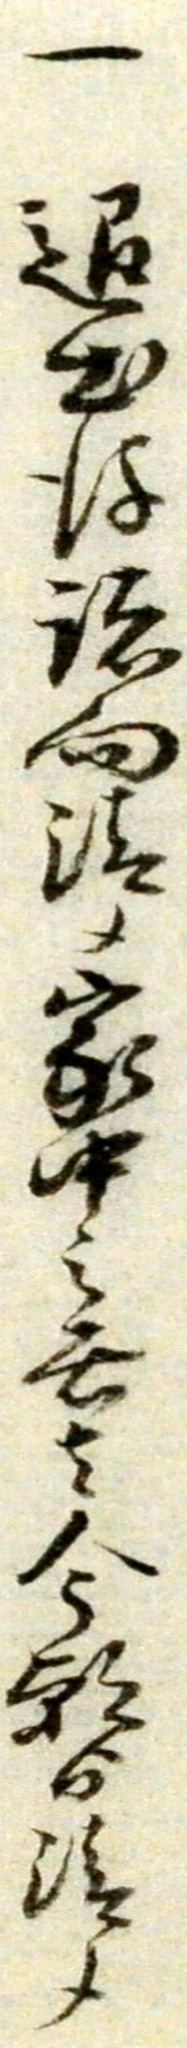一退出後諸向清メ家中之者者今朝ゟ清メ
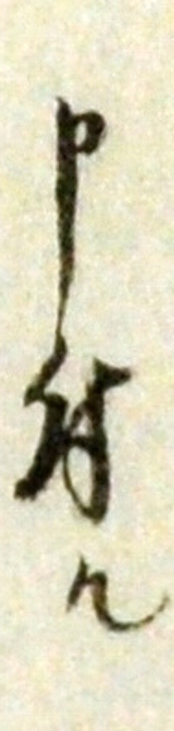申付ㇽ

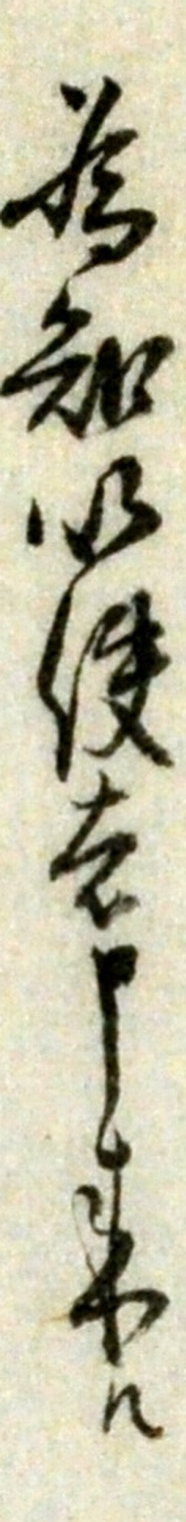為知以使者申来ㇽ
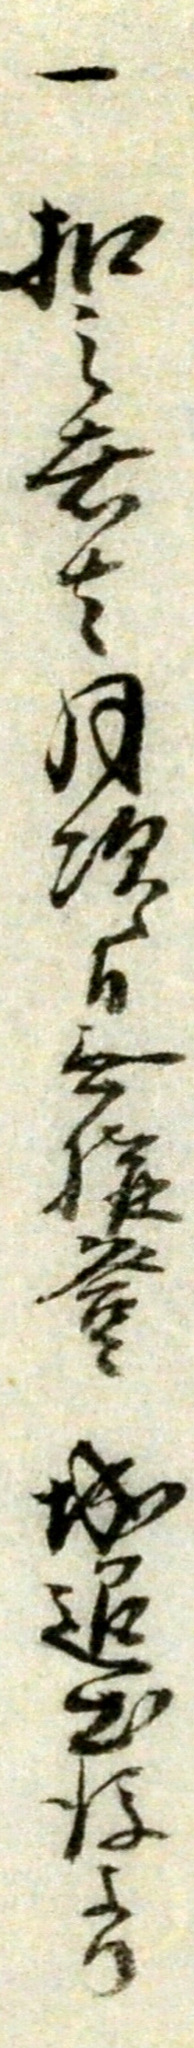一扣之者者月次二付無程登城退出後より
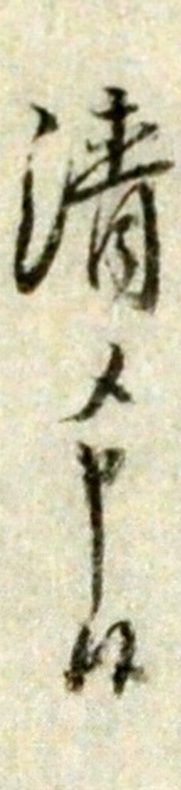清メ申候
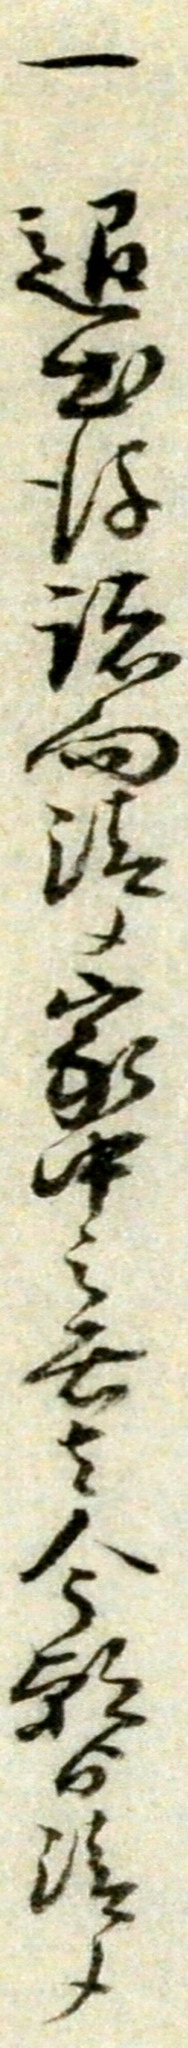一退出後諸向清メ家中之者者今朝ゟ清メ
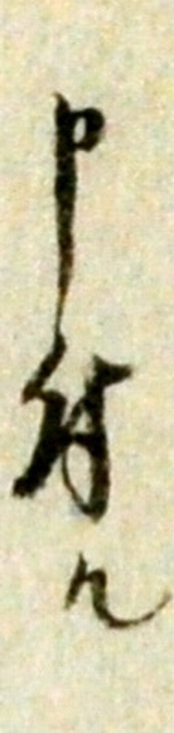申付ㇽ
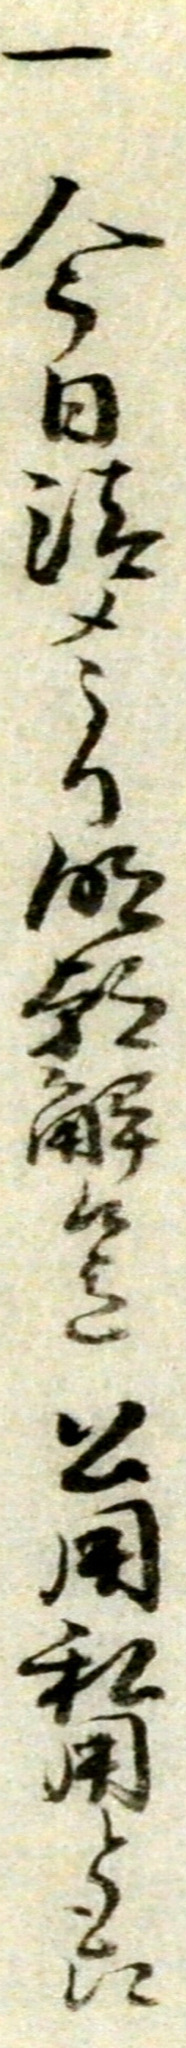一今日清メより明朝解候迠公用私用ともに
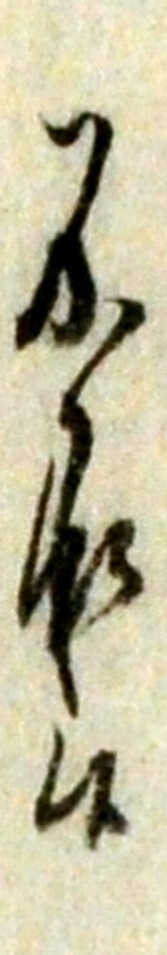不承候
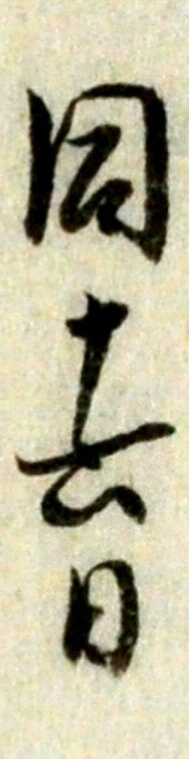同十六日
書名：日光御名代相勤候節ノ留
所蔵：伊那市立高遠町図書館・合同会社AMANE
